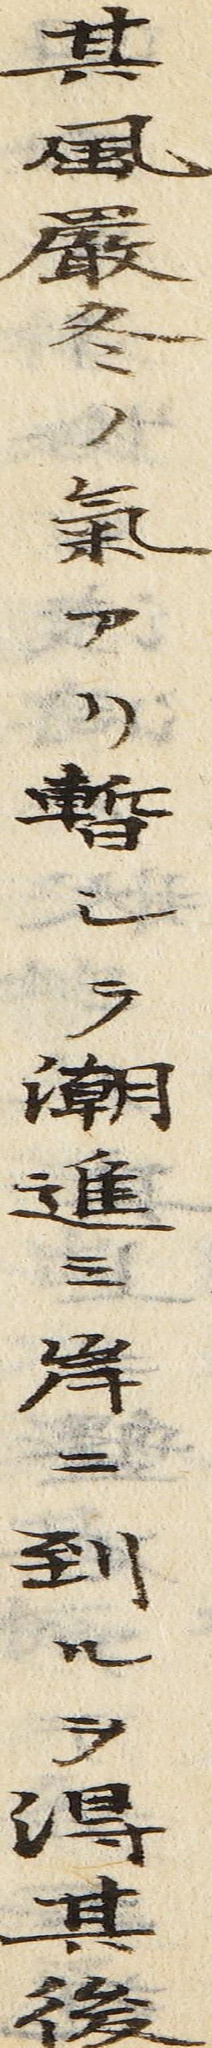其風厳冬ノ気アリ暫シテ潮進ミ岸ニ到ルヲ得其後
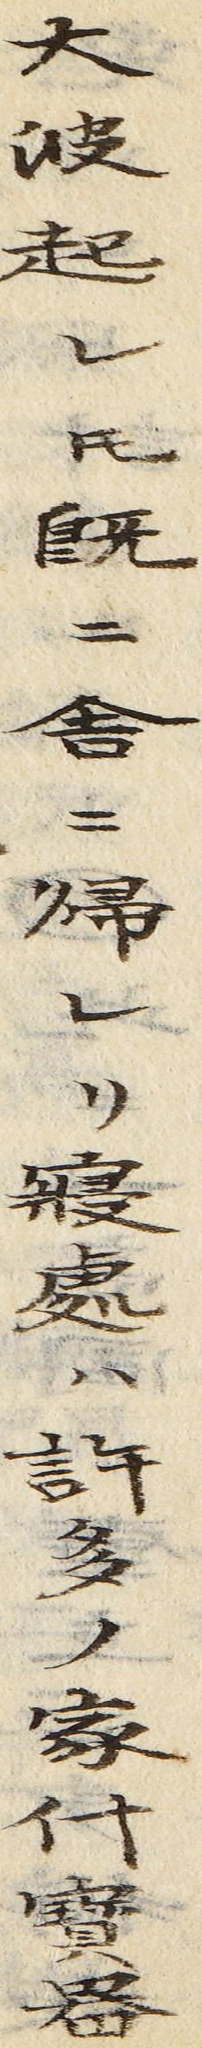大波起レトモ既ニ舎ニ帰レリ寝処ハ許多ノ家什宝器
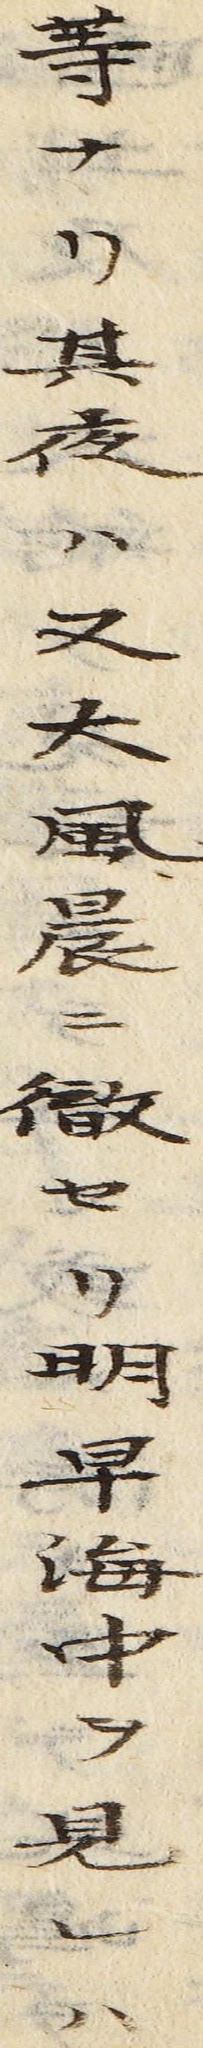等ナリ其夜ハ又大風晨ニ徹セリ明早海中ヲ見レハ
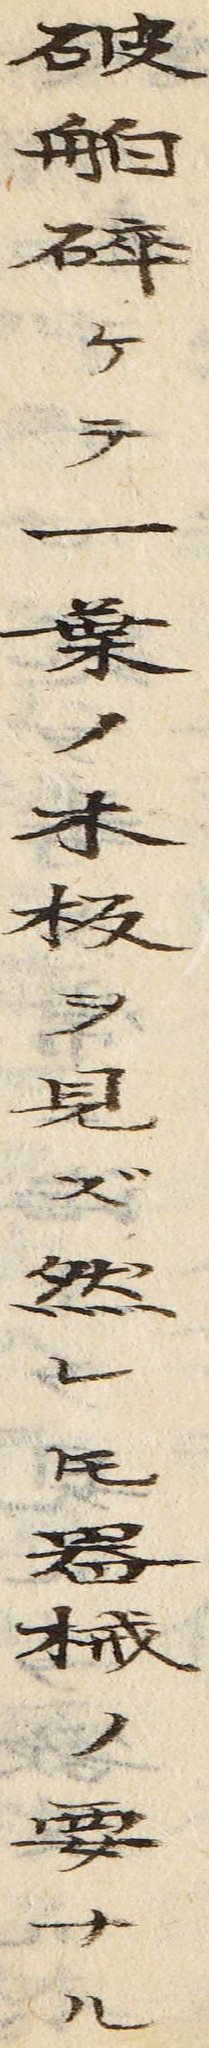破舶砕ケテ一葉ノ木板ヲ見ズ然レトモ器械ノ要ナル
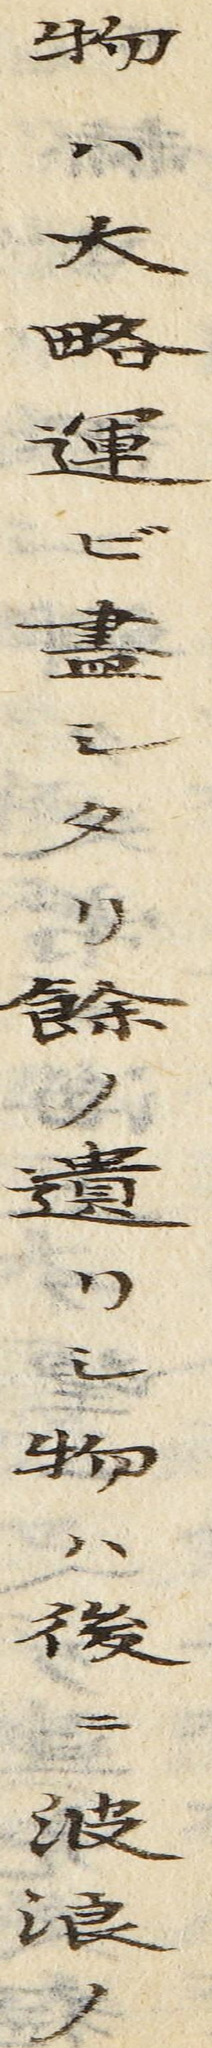物ハ大略運ビ尽シタリ余ノ遺リシ物ハ後ニ波浪ノ
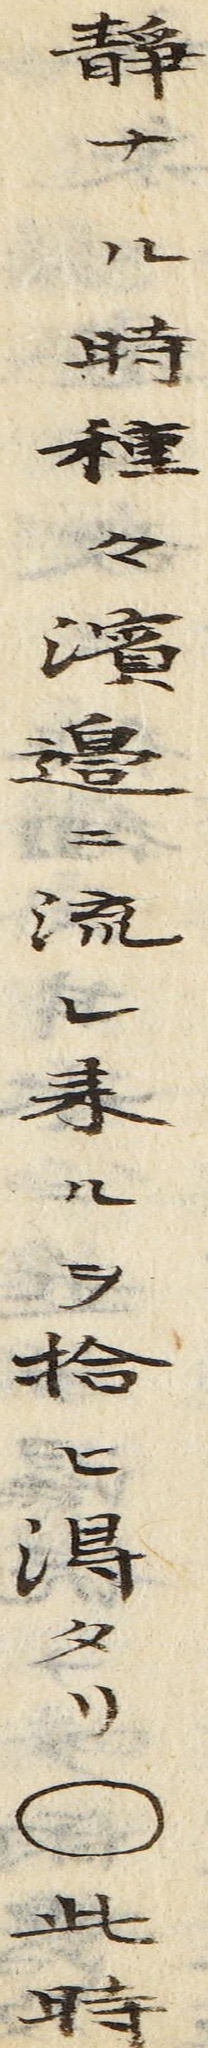静ナル時種々浜辺ニ流レ来ルヲ拾ヒ得タリ◯此時
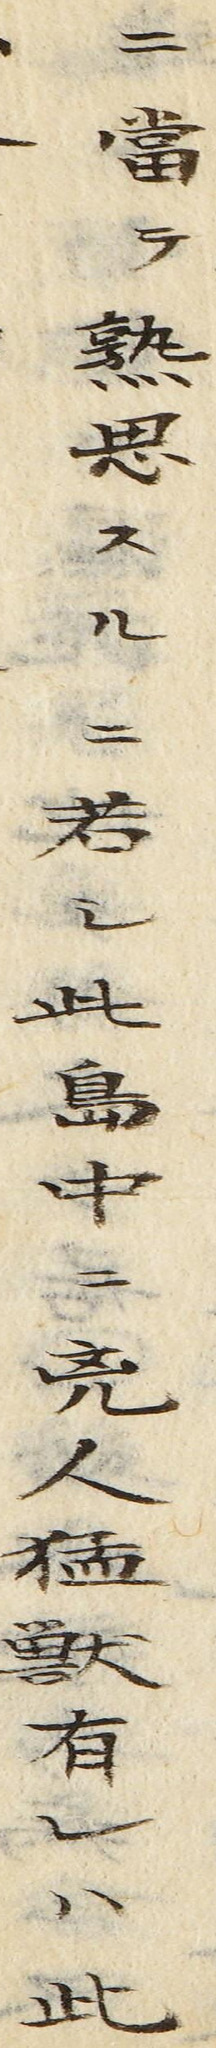ニ当テ熟思スルニ若シ此島中ニ兇人猛獣有レハ此
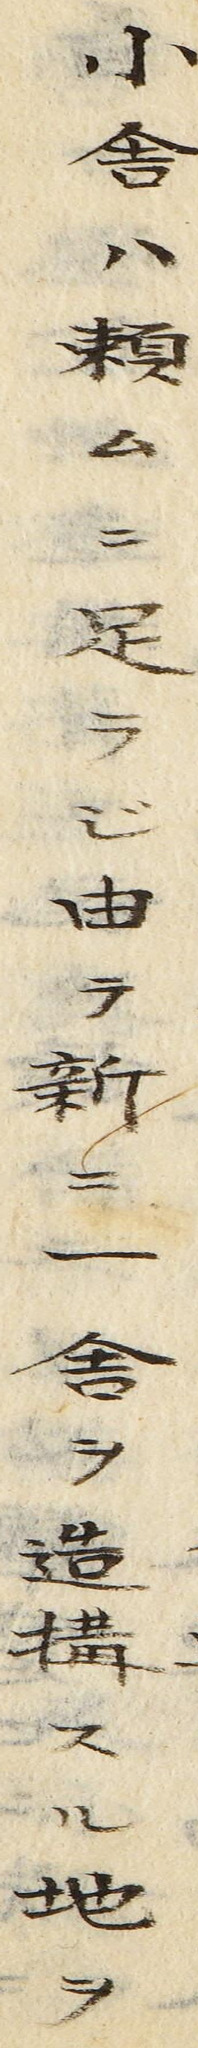小舎ハ頼ムニ足ラジ由テ新ニ一舎ヲ造搆スル地ヲ

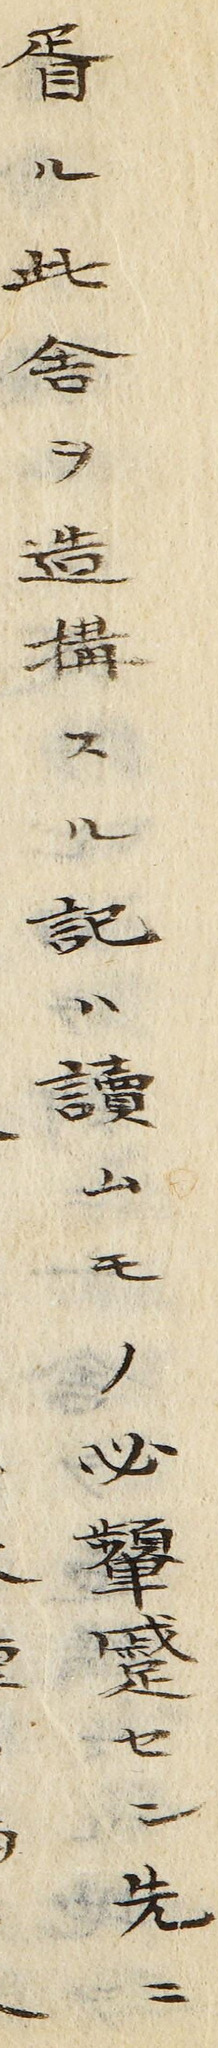胥ル此舎ヲ造搆スル記ハ読ムモノ必顰蹙セン先ニ
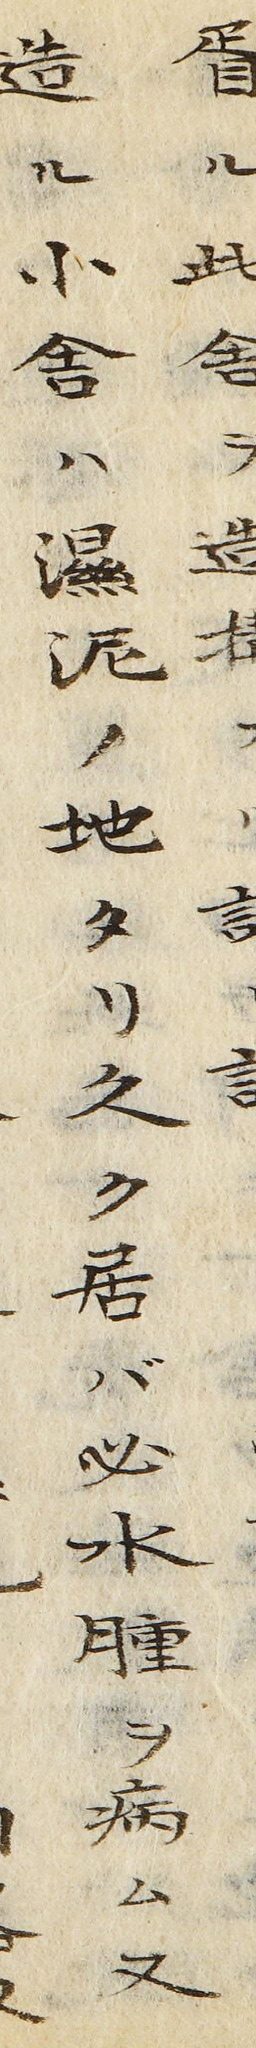造ル小舎ハ湿泥ノ地タリ久ク居バ必水腫ヲ病ム又
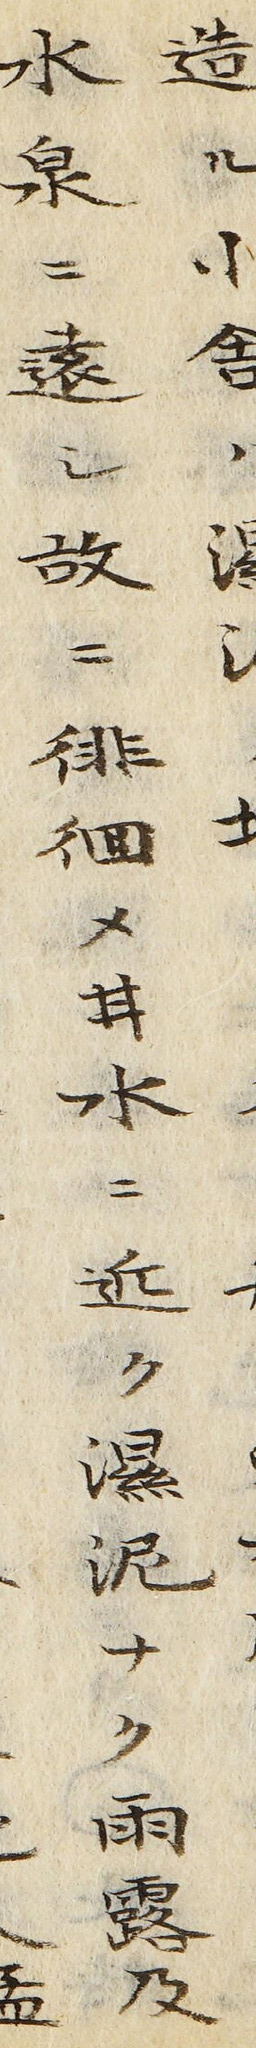水泉ニ遠シ故ニ徘徊シテ井水ニ近ク湿泥ナク雨露及
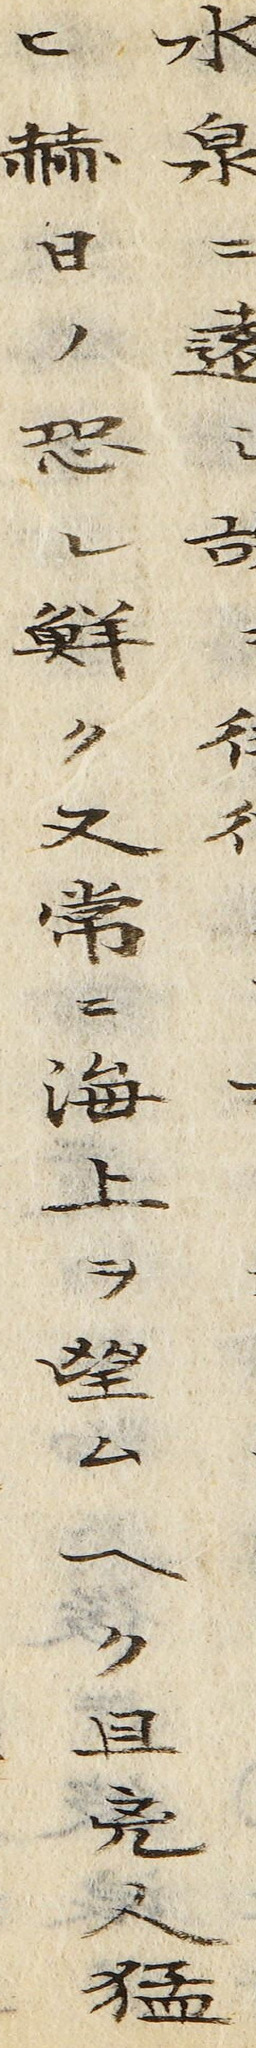ヒ赫日ノ恐レ鮮ク又常ニ海上ヲ望ムヘク且兇人猛
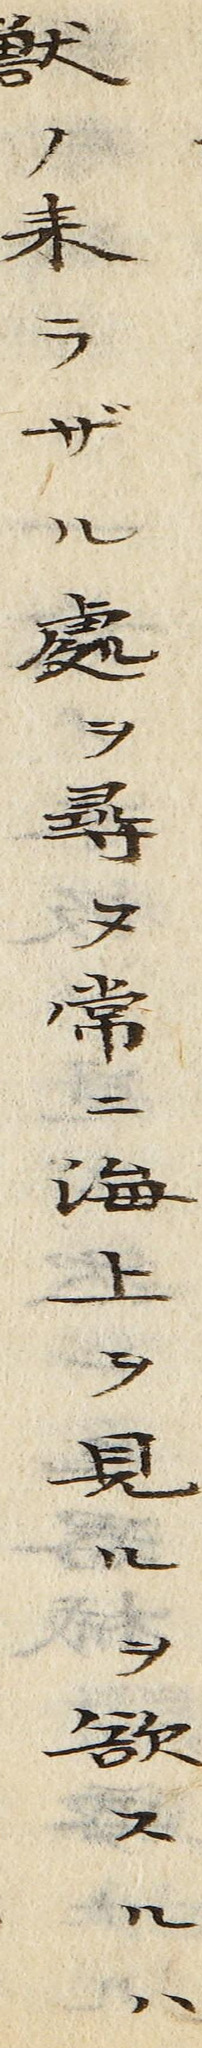獣ノ来ラザル処ヲ尋ヌ常ニ海上ヲ見ルヲ欲スルハ
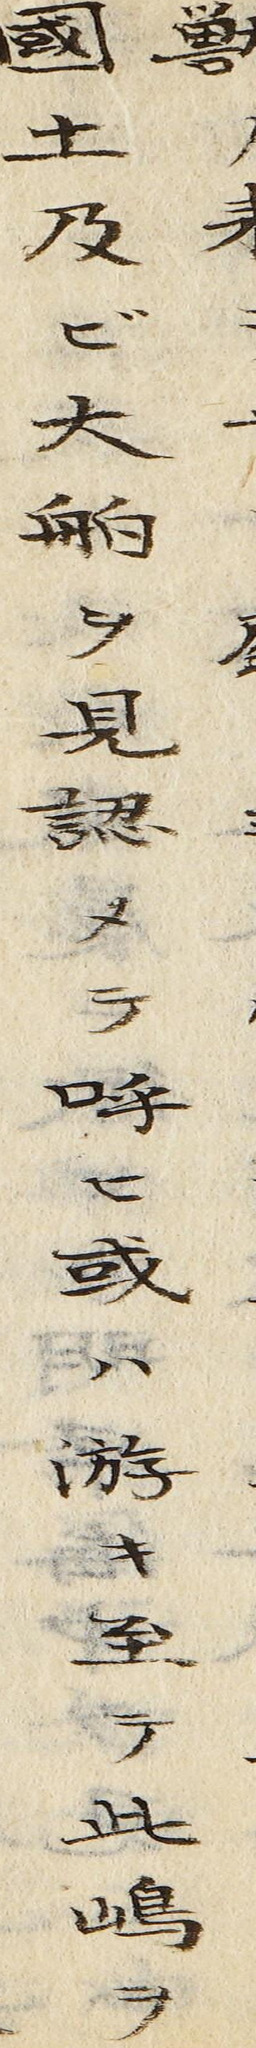国土及ビ大舶ヲ見認メテ呼ヒ或ハ游キ至テ此島ヲ
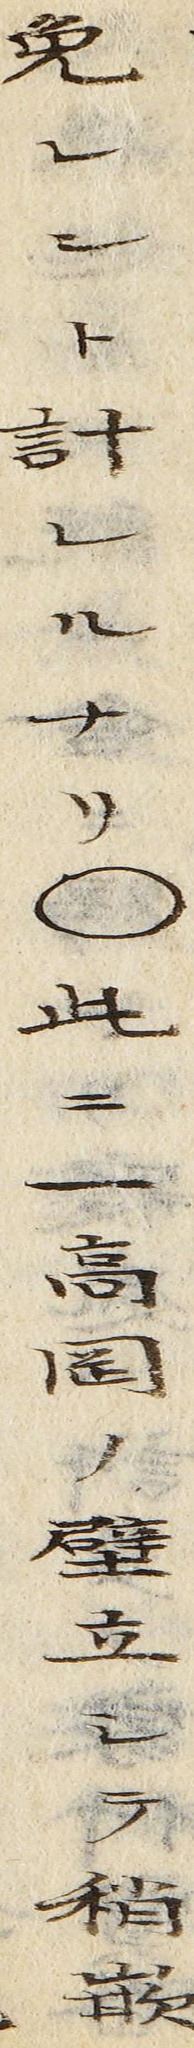免レント計レルナリ◯此ニ一高岡ノ壁立シテ稍嵌
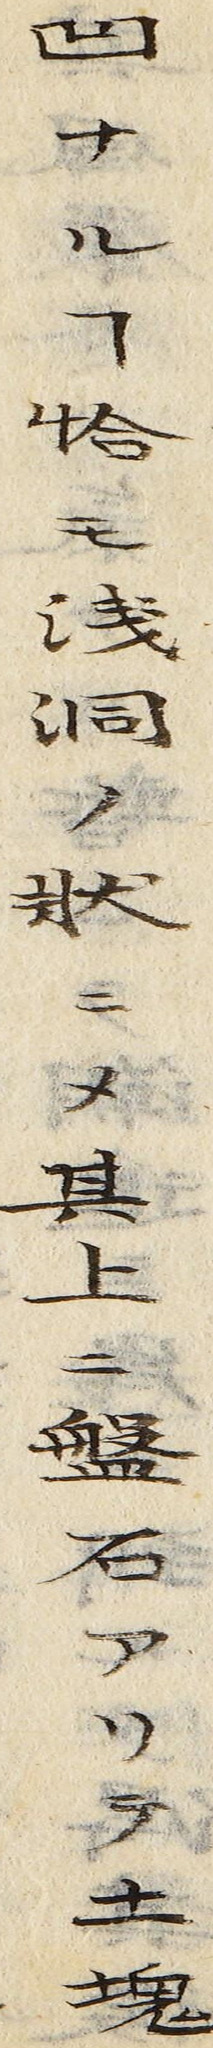凹ナルコト恰モ浅洞ノ状ニシテ其上ニ盤石アリテ土塊
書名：漂流紀事
